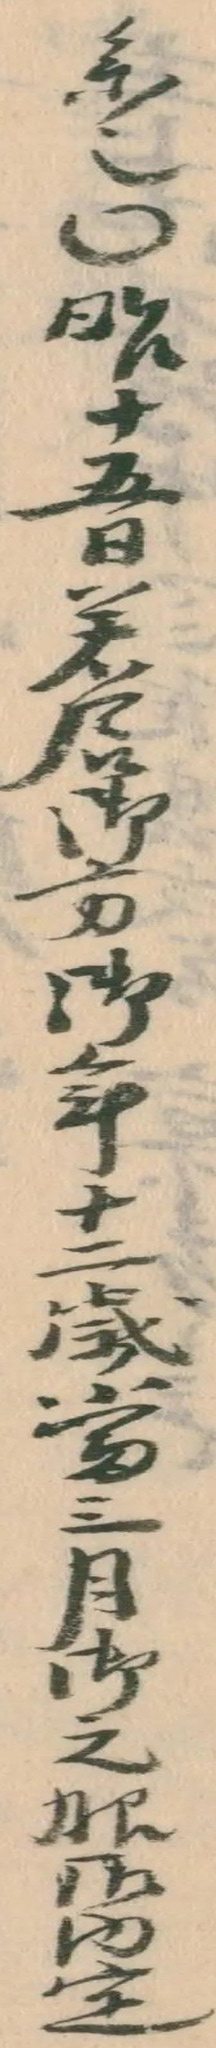参也○昨十五日若君御方御年十二歳當三月御元服御内定
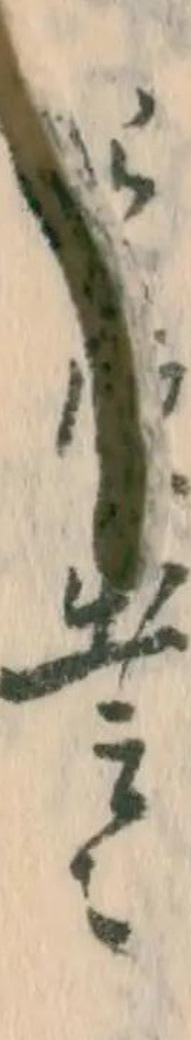被仰出云々
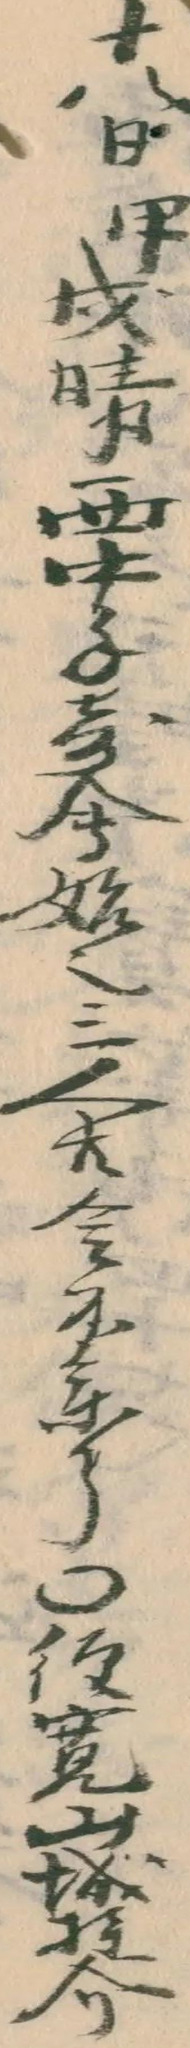十八日甲戌晴西中手寄會始也三人共令不参了〇経寛山城権介
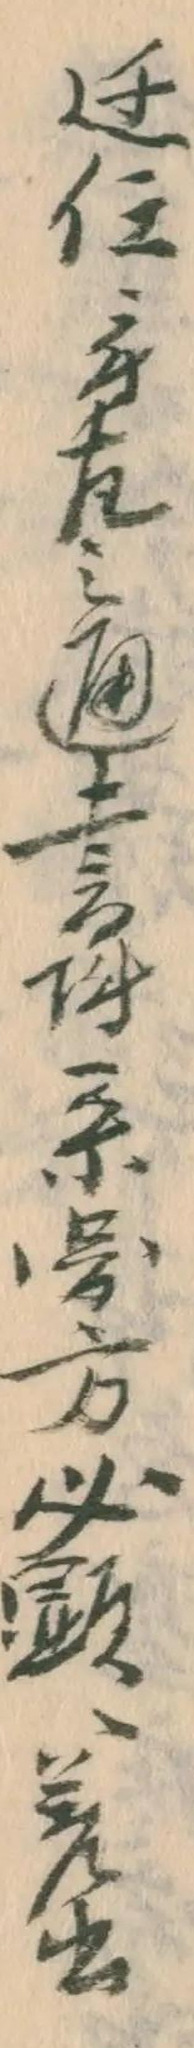遷任ニ付左之通書附系図方必顕へ差出
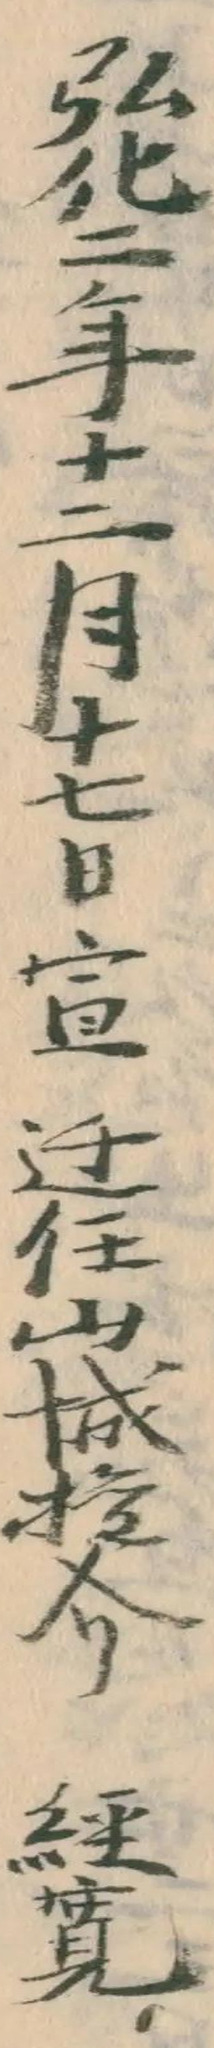弘化二年十二月十七日宣遷任山城権介経寛
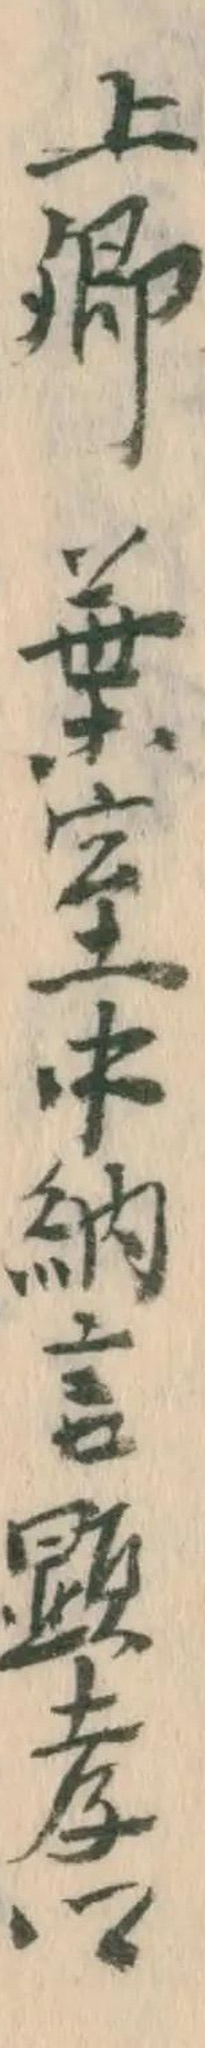上卿葉室中納言顕孝卿
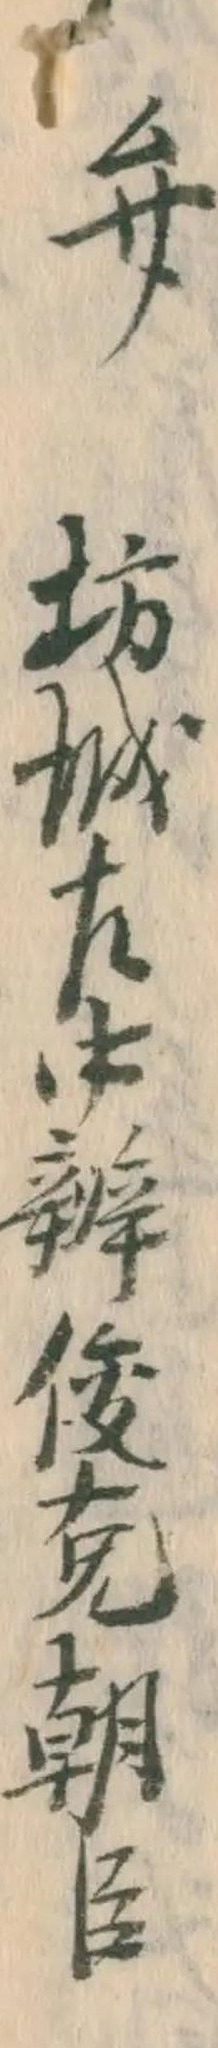弁坊城左中辨俊克朝臣
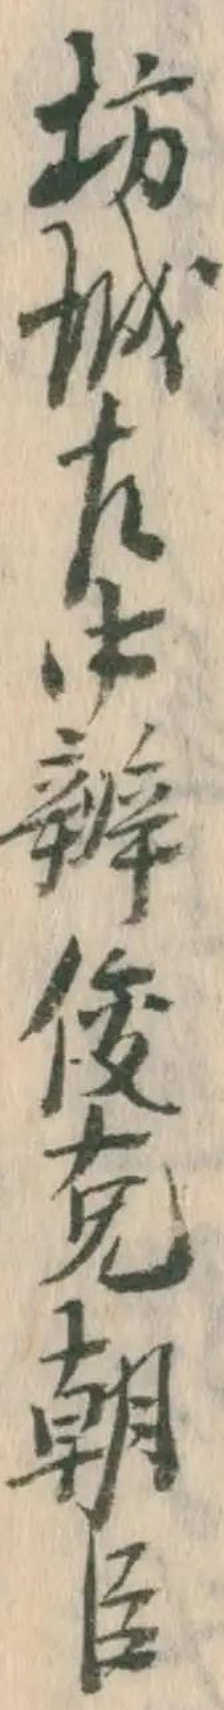弁坊城左中辨俊克朝臣
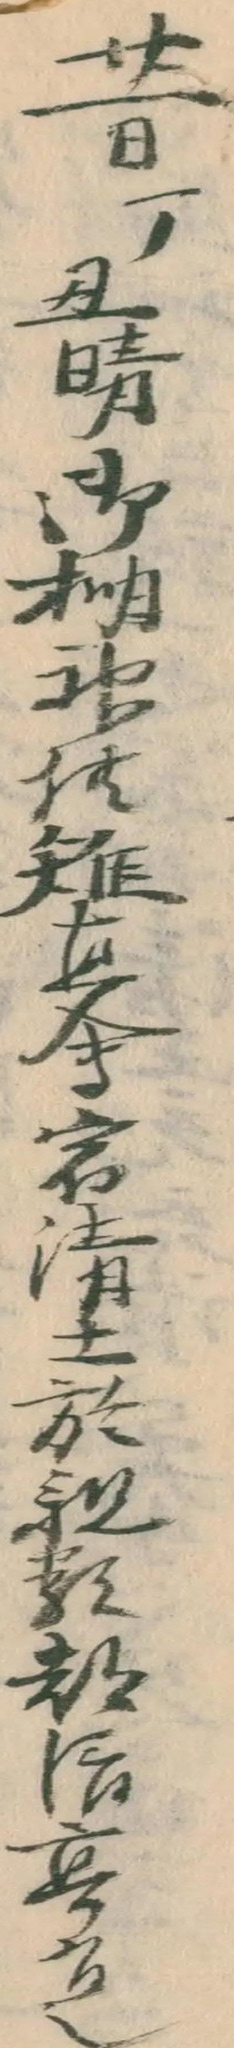廿一日丁丑晴御棚神供雉直會宿清土於親類都清亭有之
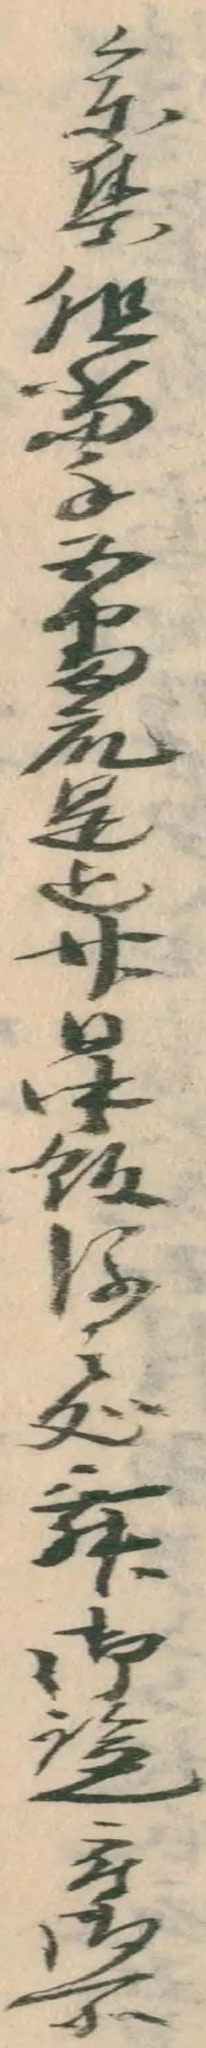参集但當年五番衆是迄廿日中飯後之処舞御覧ニ付御所
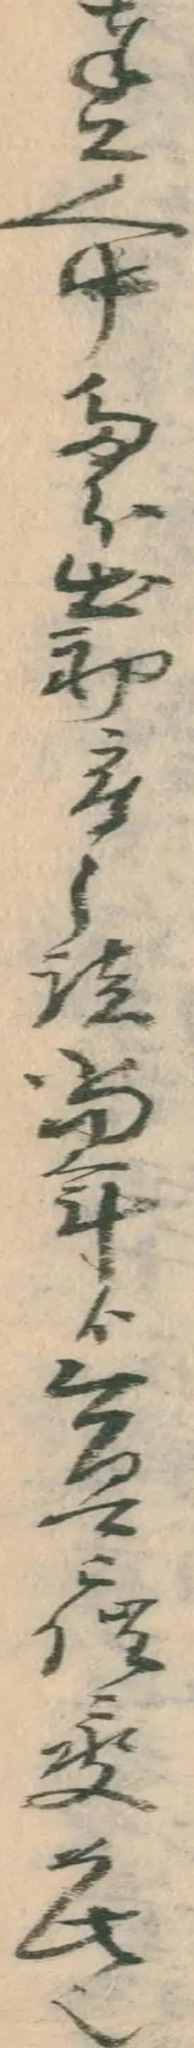奉公人中多分出勤ニ付申談當年ゟ今日可被催ニ決而此也

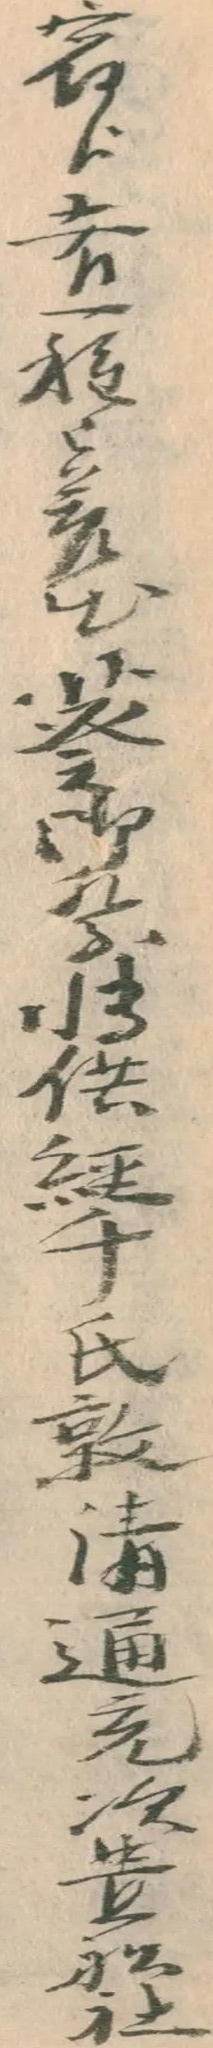宿ゟ肴一種被差出葵御祭轉供経千氏敦清通充次豊舩社
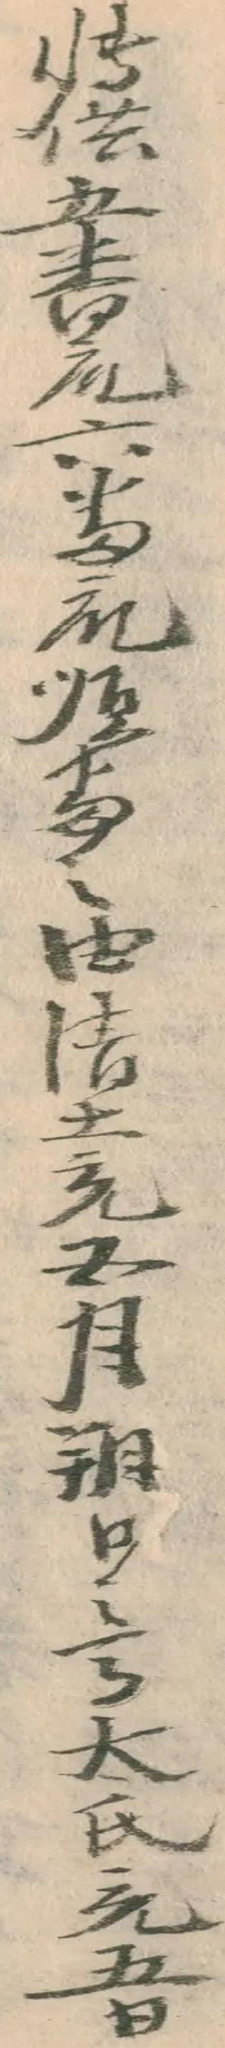轉供五番衆六番衆順番之由清土充五月朔日之馬太氏充五日
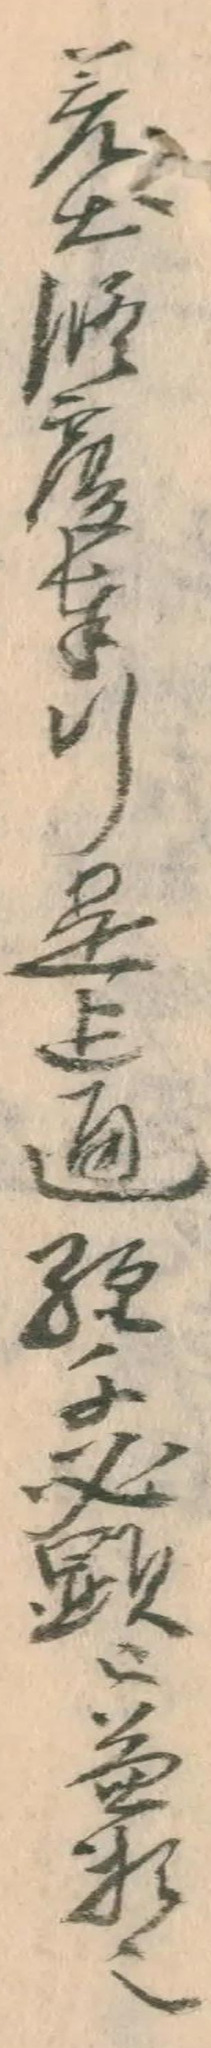差出修覆奉行是迄通経千必顕被兼頼也
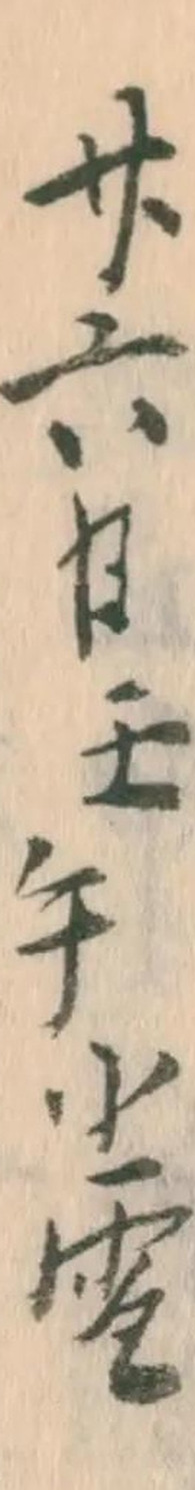廿六日壬午小雪
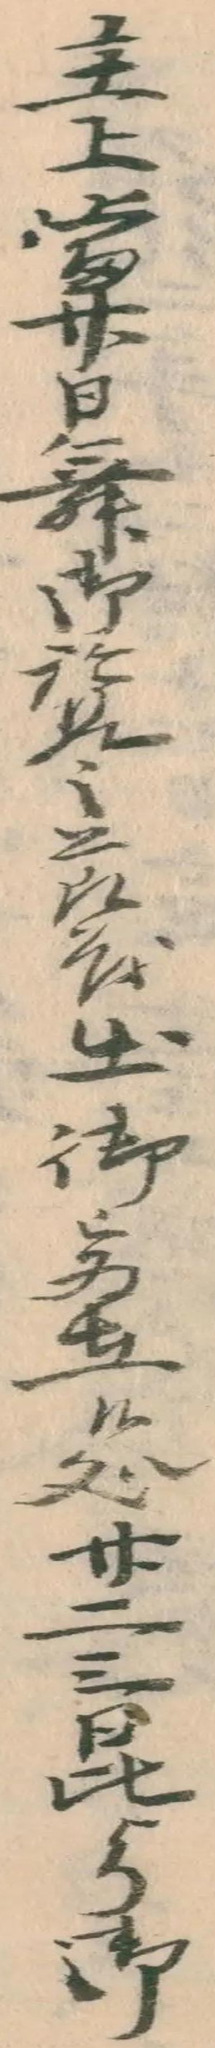主上當廿日舞御覧之節も出御被為在候処廿二三日比より御
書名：賀茂社記録. 第70冊
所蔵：国立国会図書館 National Diet Library, JAPAN
